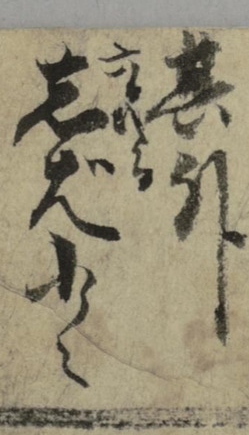しば少々
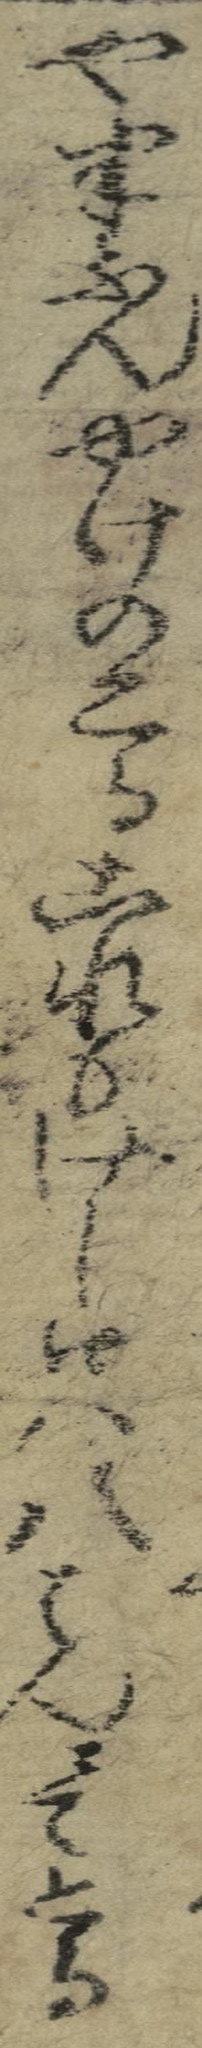や半ふんやけのこるこれもけし口ハ八はん二てとる
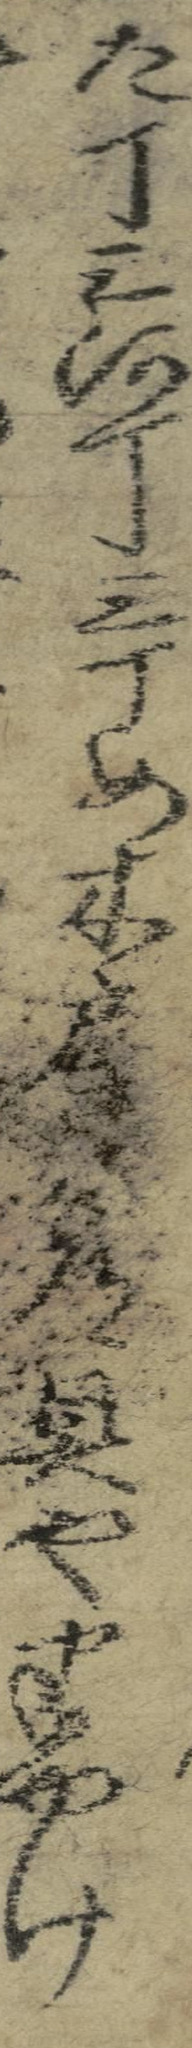た丁三河丁三丁目木戸口道具や半やけ
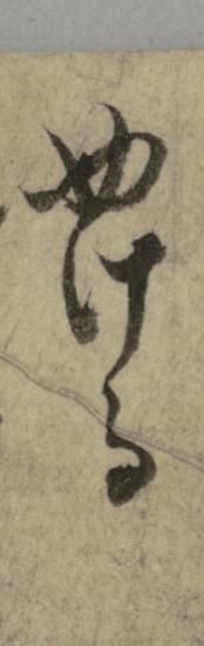やける
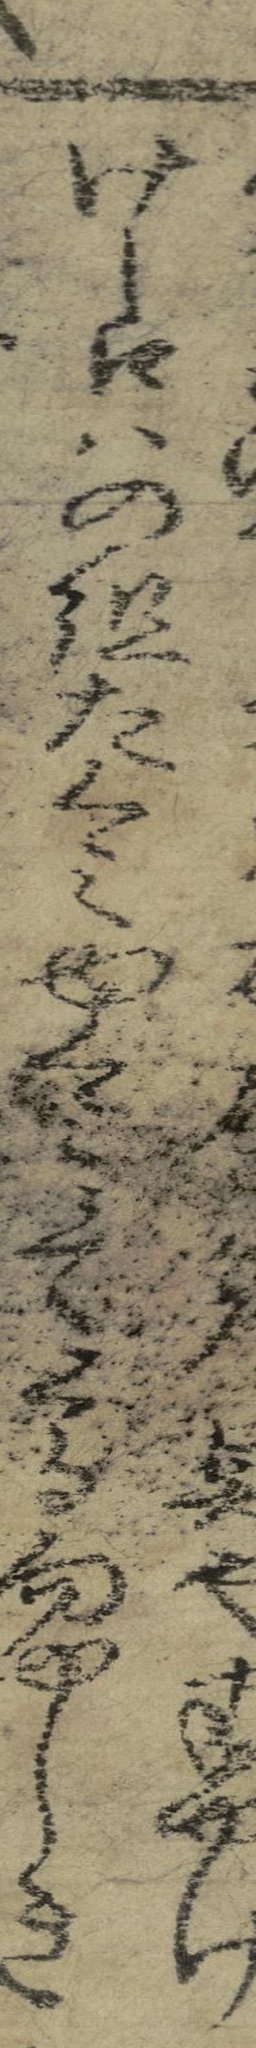けし口ハの組たくミやくミ二てとる向やしき
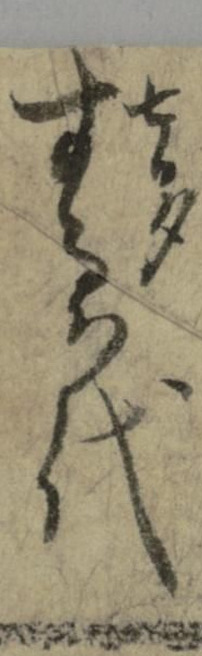するか代
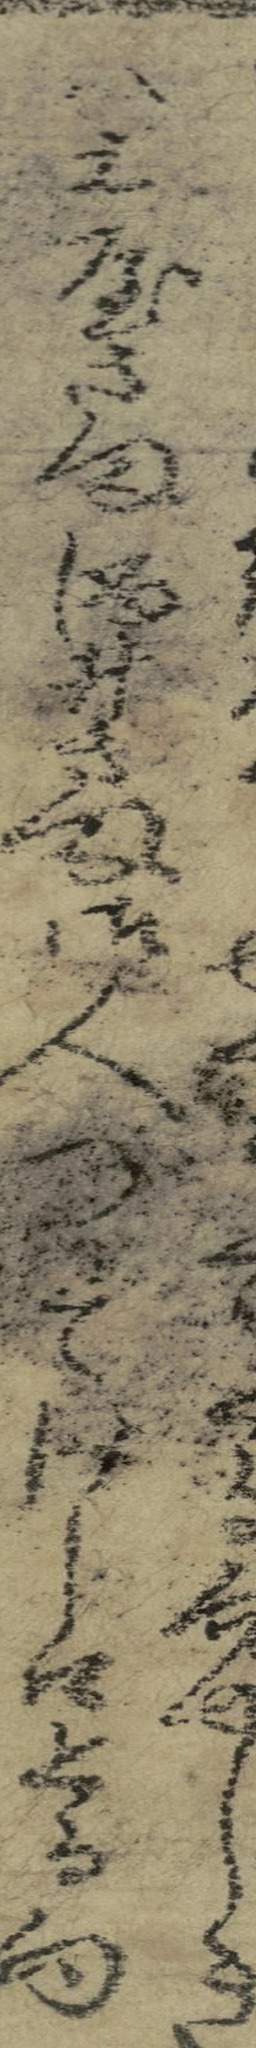ハ主殿さま酒井様御人づ二てけし口とる向
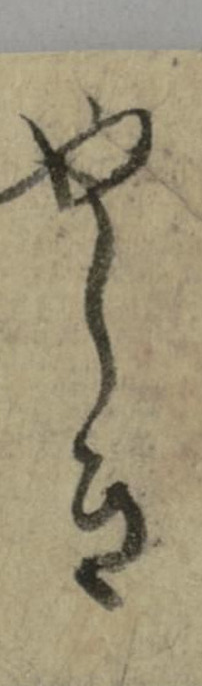やしき
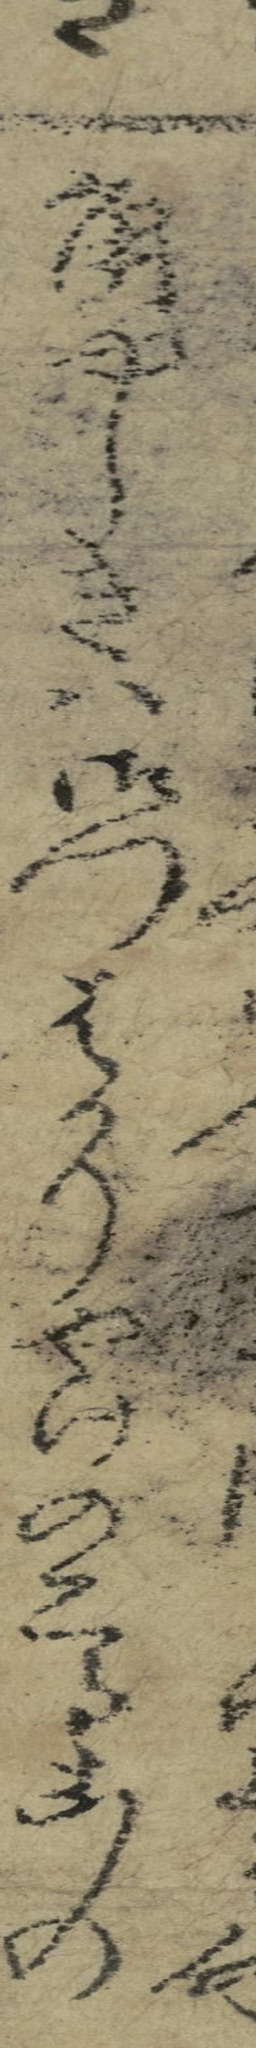角やしきハ御門はかりやけのこるこの
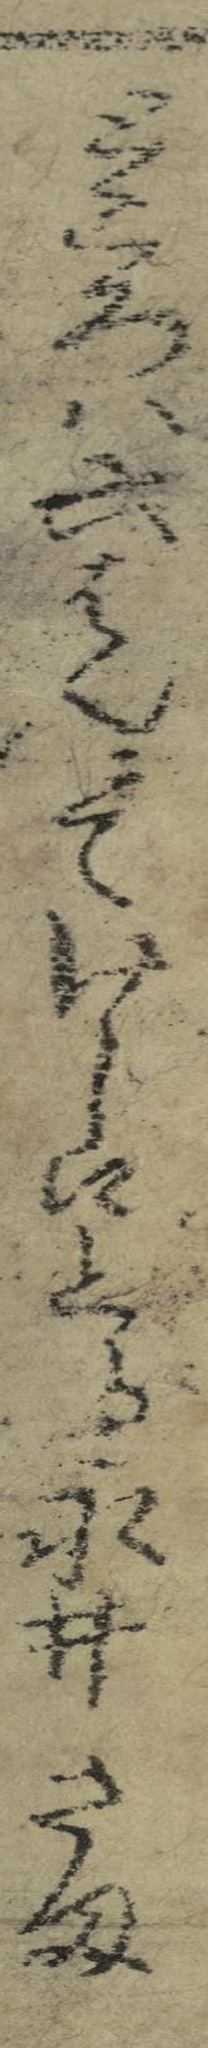ところハ六はん二てけし口とる永井さま
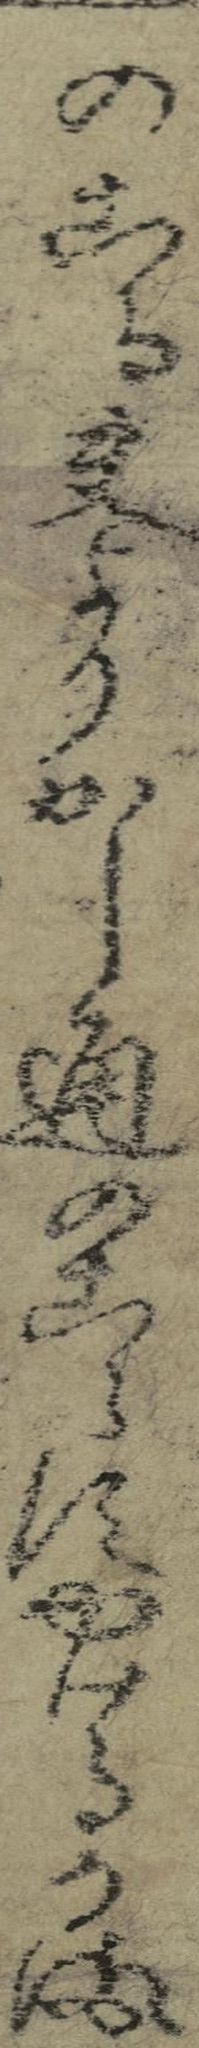のこる夫よりかし通のこらすやけるかま
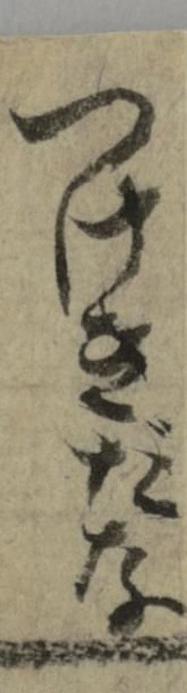つけきたな
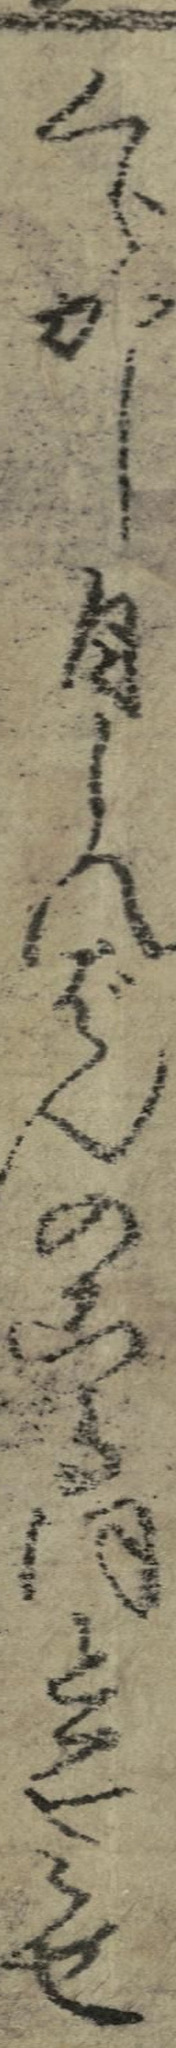くらかし自しんばんのこる同とこミせ
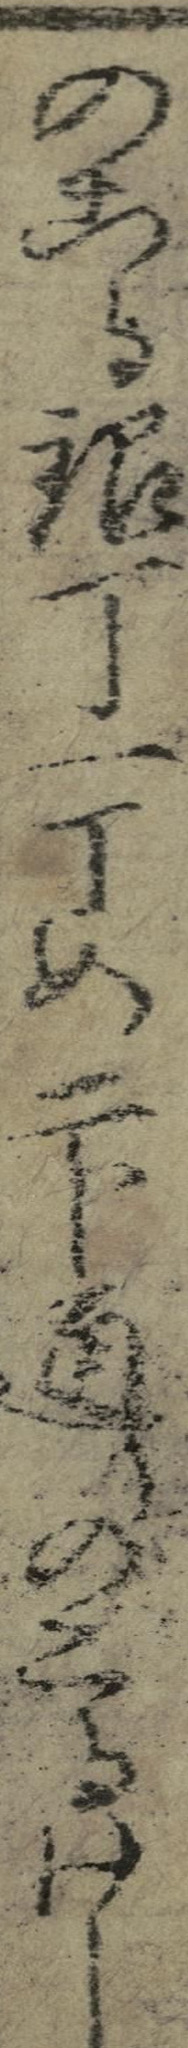のこる銀丁一丁め二分通りのこるけし
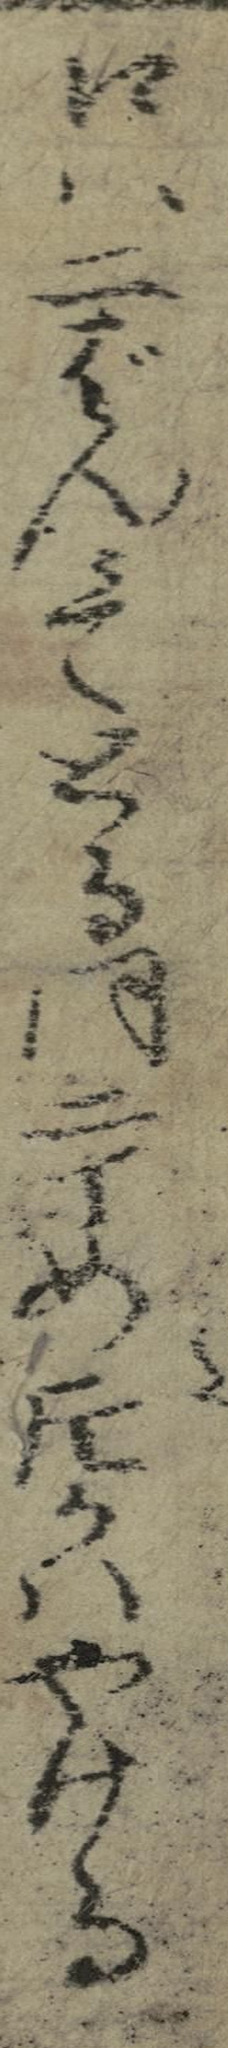口ハ二ばん二てとる同二丁め片かハやける
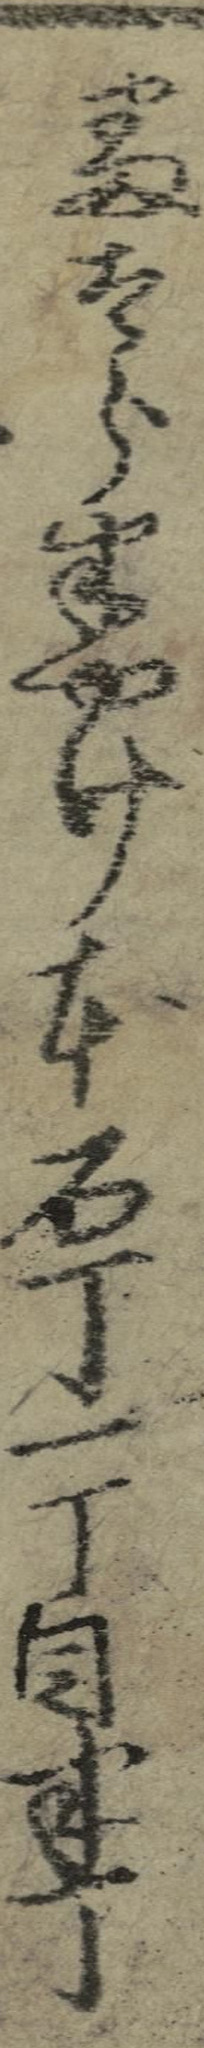番太郎半やけ本石丁一丁目半丁
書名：[慶応二年十一月の江戸大火に関する瓦版]
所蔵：東京大学地震研究所図書室 Earthquake Research Institute Library, The University of Tokyo, JAPAN
